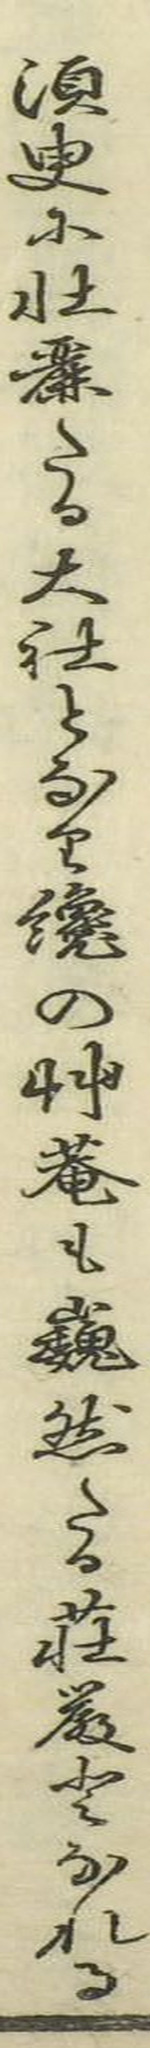須臾に壮麗たる大社となり纔の草庵も巍然たる荘厳となれる
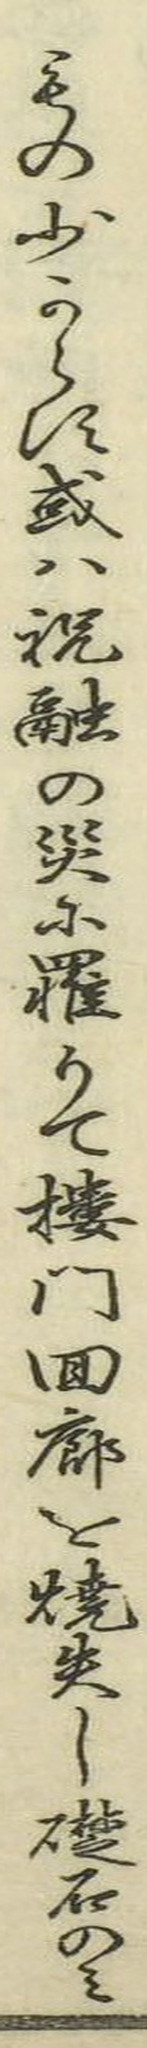もの少からす或は祝融の災に罹りて楼門回廊を消失し礎石のみ
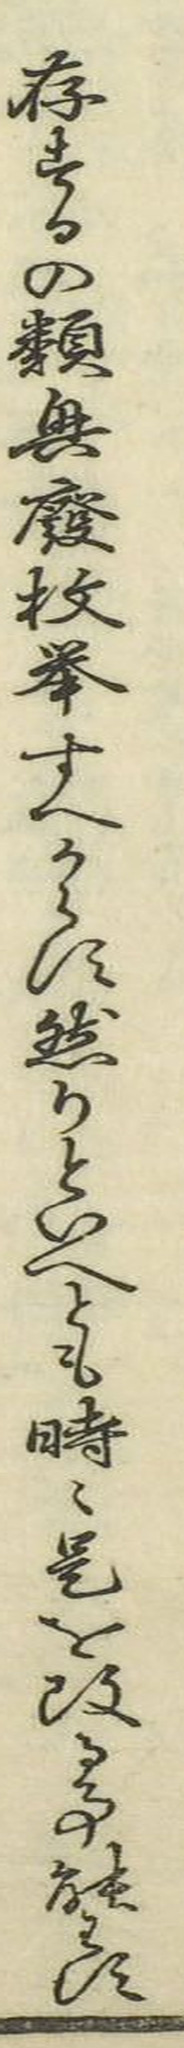存するの類興廃枚挙すへからす然りといへとも時々是を改る事能わす
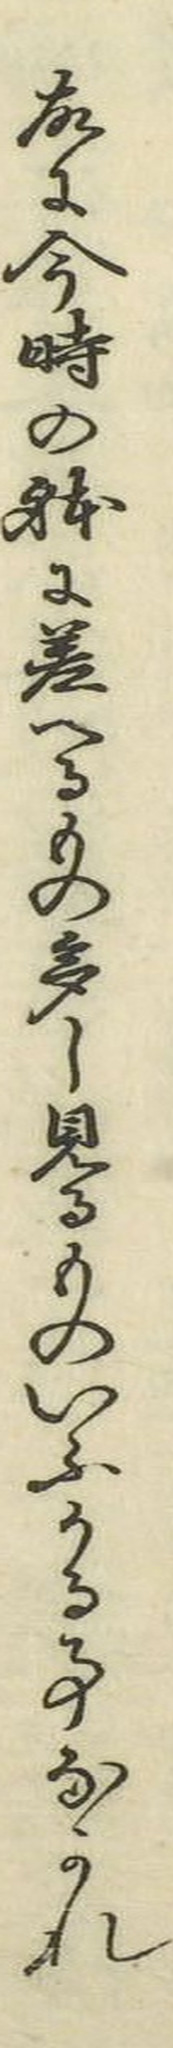故に今時の体に差へるもの多し見るものいふかる事なかれ
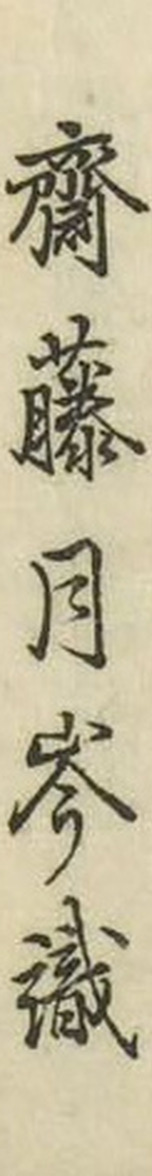斉藤月岑識
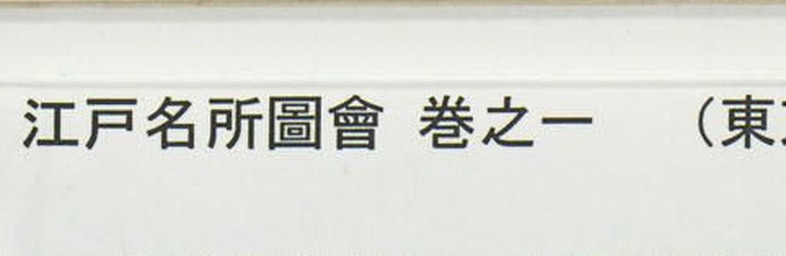江戸名所図会巻之一
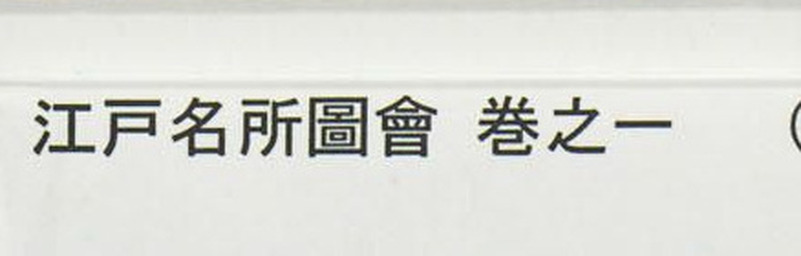江戸名所図会巻之一
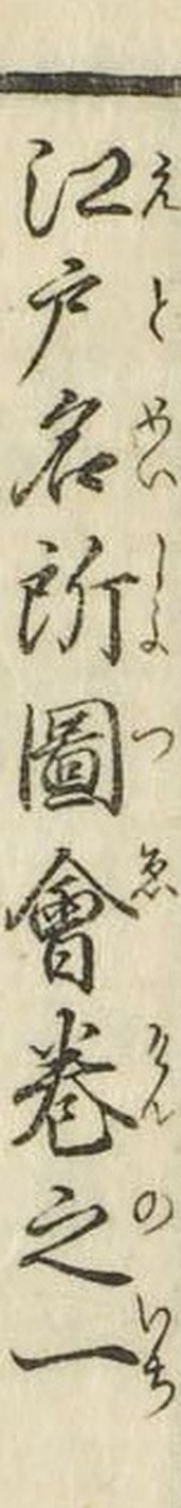江戸名所図会巻之一
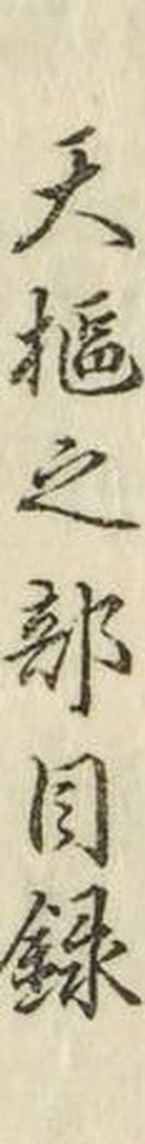天枢之部目録
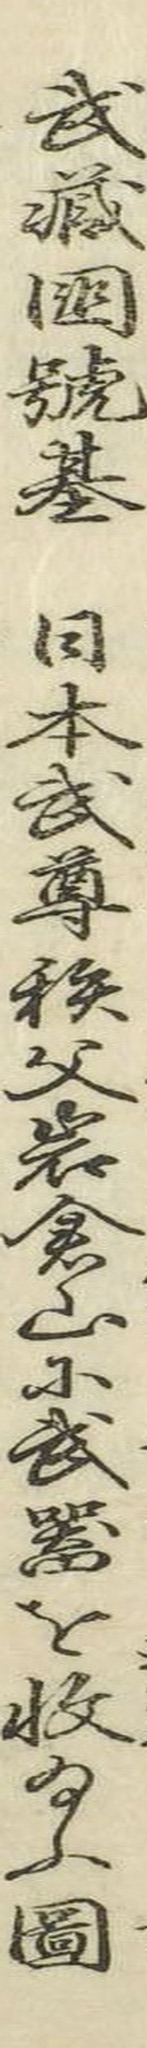武蔵国号基日本武尊秩父岩倉山に武器を収給ふ図
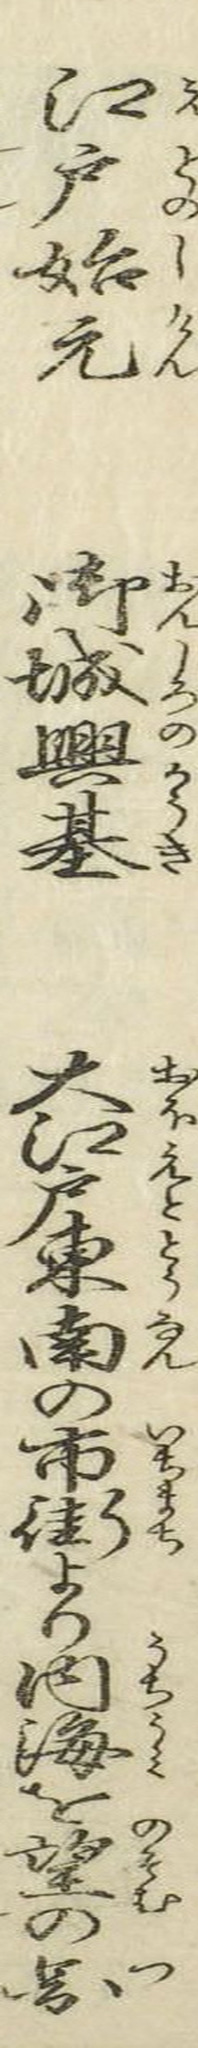江戸始元御城興基大江戸東南の市街より内海を望の図

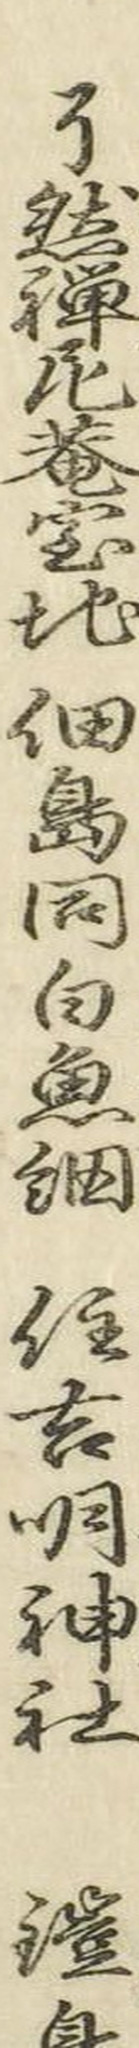了然禅尼菴室地佃島同白魚網住吉明神社鎧島

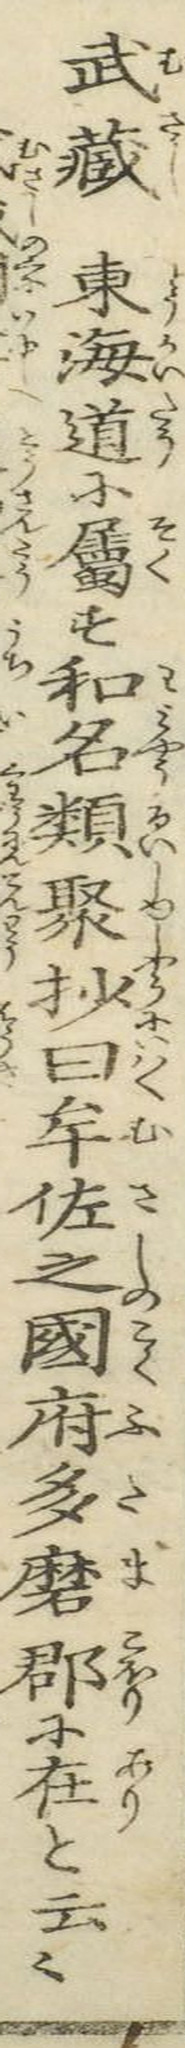武蔵東海道に属す和名類聚楽抄曰牟佐之国府多磨郡に在と云々
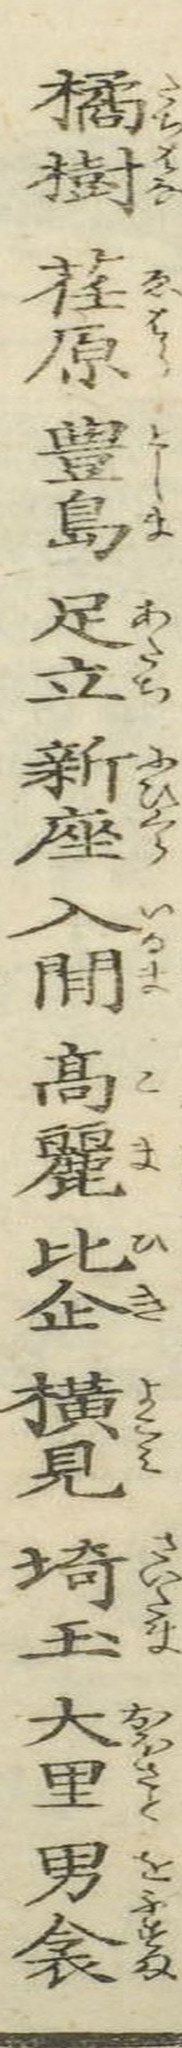橘樹荏原豊島足立新座入間高麗比企横見埼玉大里男衾
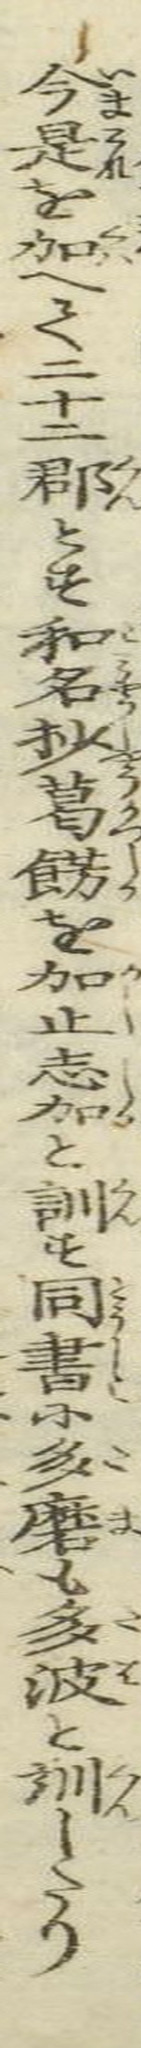今是を加へて二十二郡とす和名抄葛錺を加止志加と訓す同書に多磨も多波と訓したり
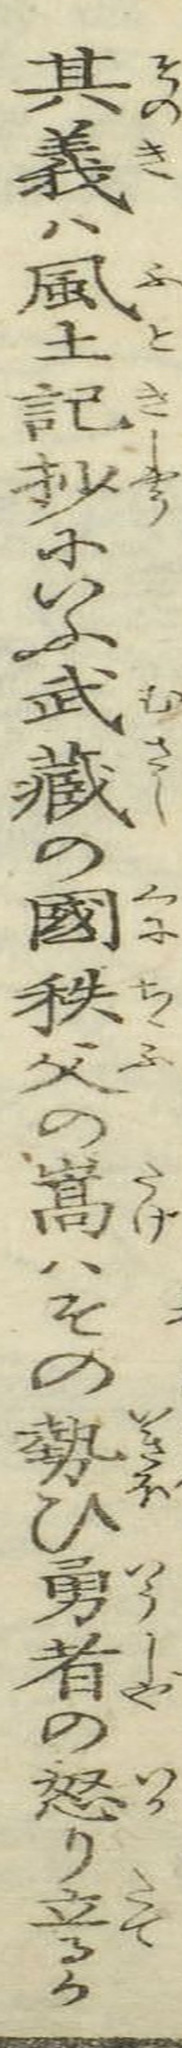其義は風土記抄にいふ武蔵の国秩父の嵩はその勢ひ勇者の怒り立るか
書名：江戸名所図会 20巻 巻之1
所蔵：東京学芸大学教育コンテンツアーカイブ
